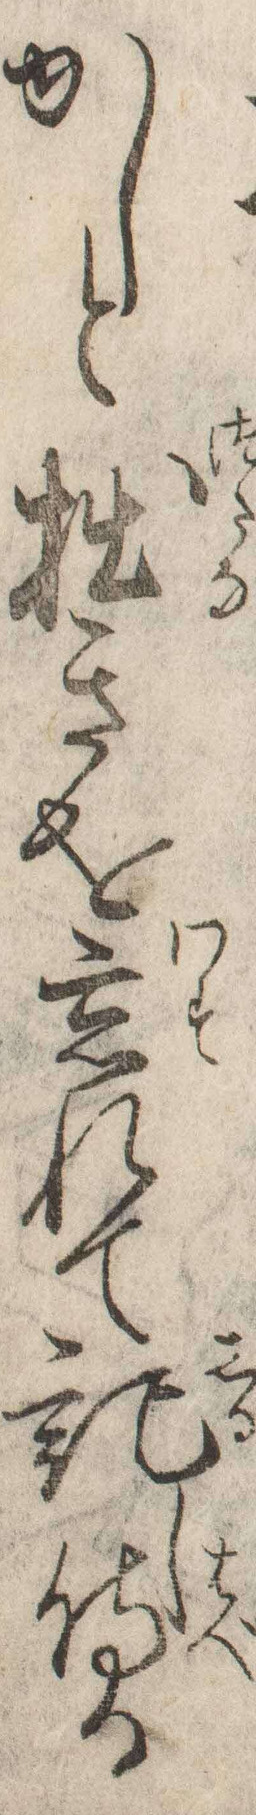かしと拙きを忘れて記し侍る

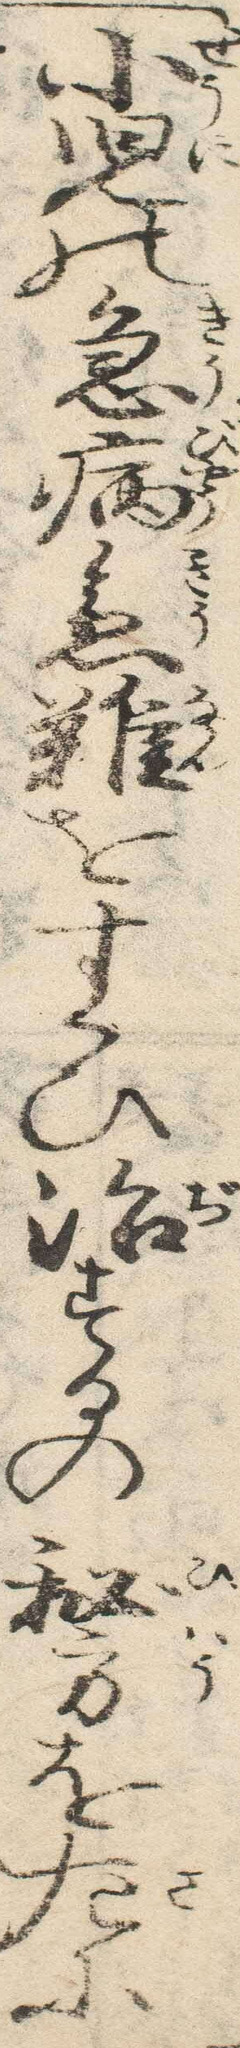小児の急病急難をすくひ治するの秘方を左に
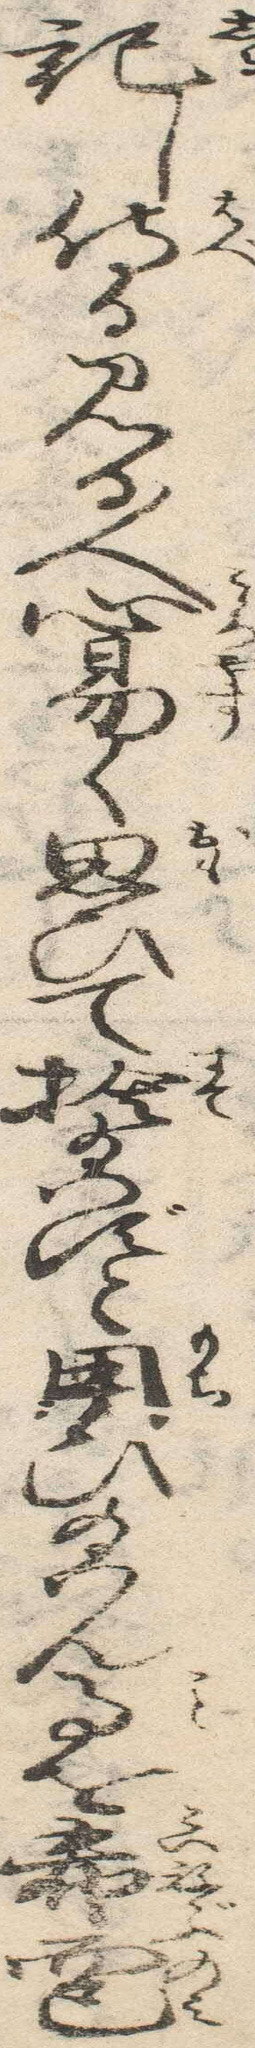記し侍る見る人心易く思ひて捨給はずと用ひ給はん事を希而已
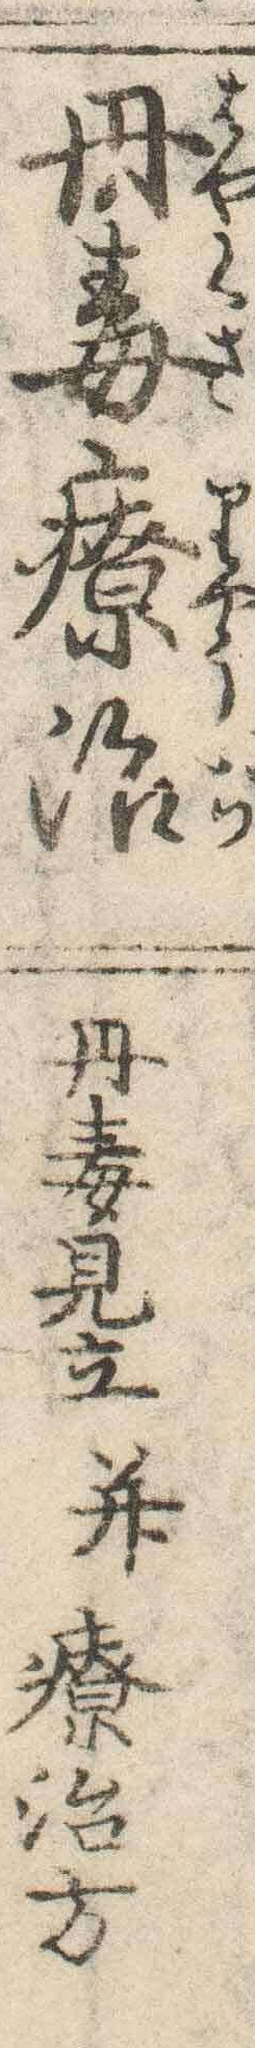丹毒療治丹毒見立并療治方
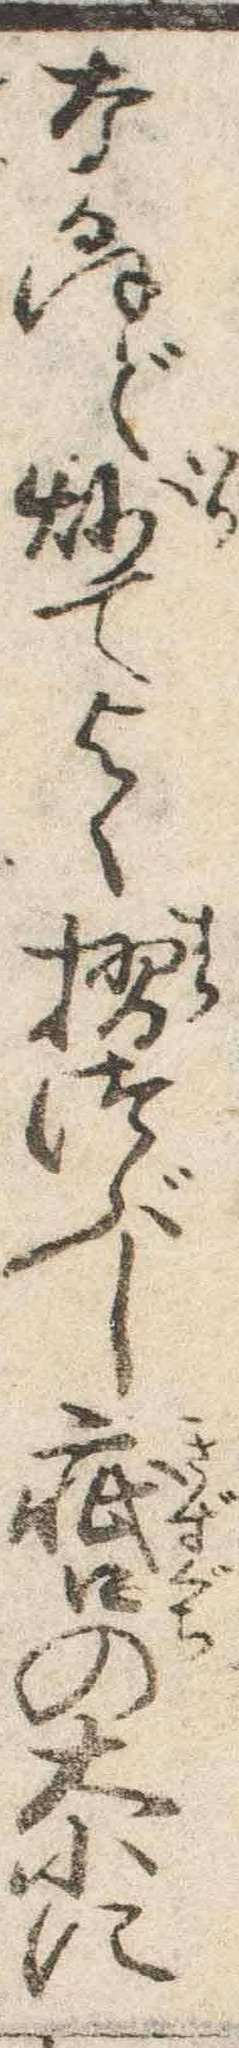なるほど炒てよく摺つぶし疵口の大小に
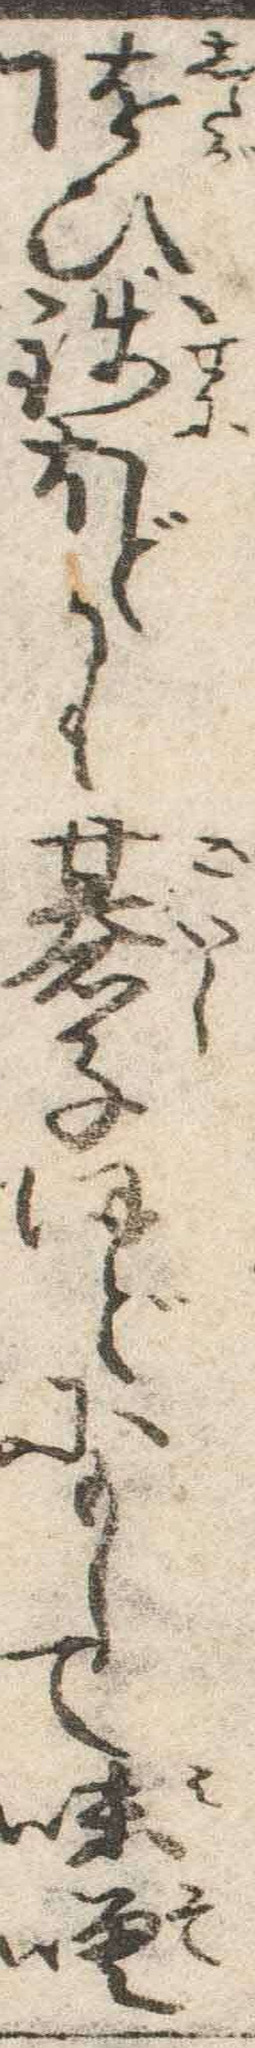随ひ銭ほどにも碁子ほどにもして味噌
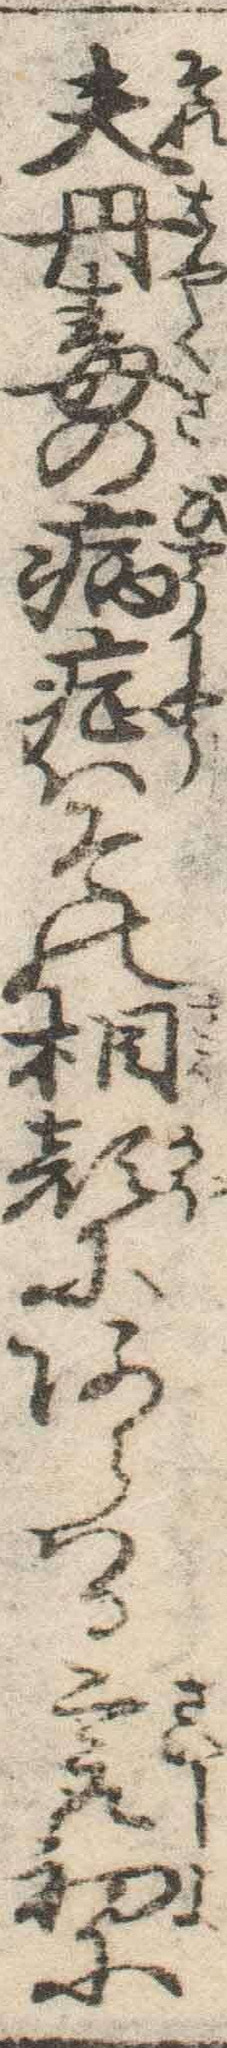夫丹毒の病症はその相顔にあらはる最初に
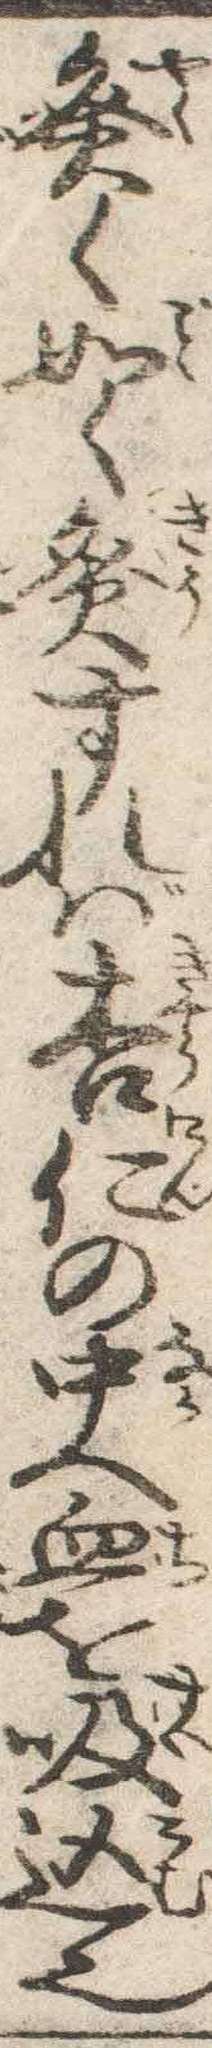灸如く灸すれば杏仁の中へ血を吸込也
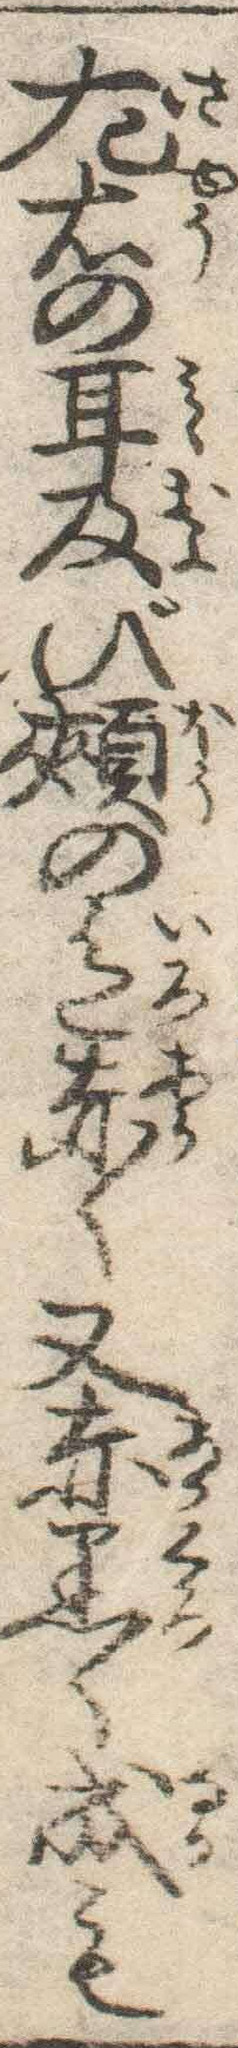左右の耳及び頬の色赤く又赤黒く成も
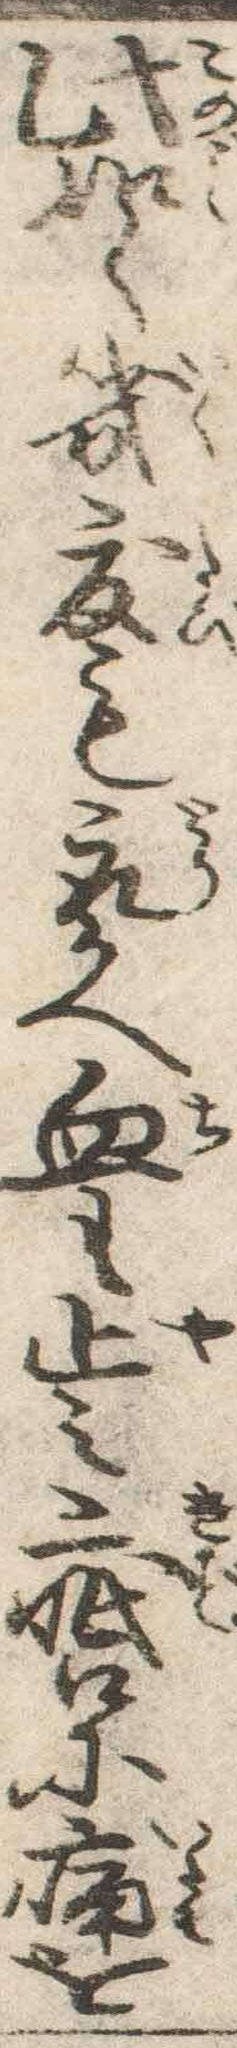此如く幾度も取かへ血も止み疵口に痛を
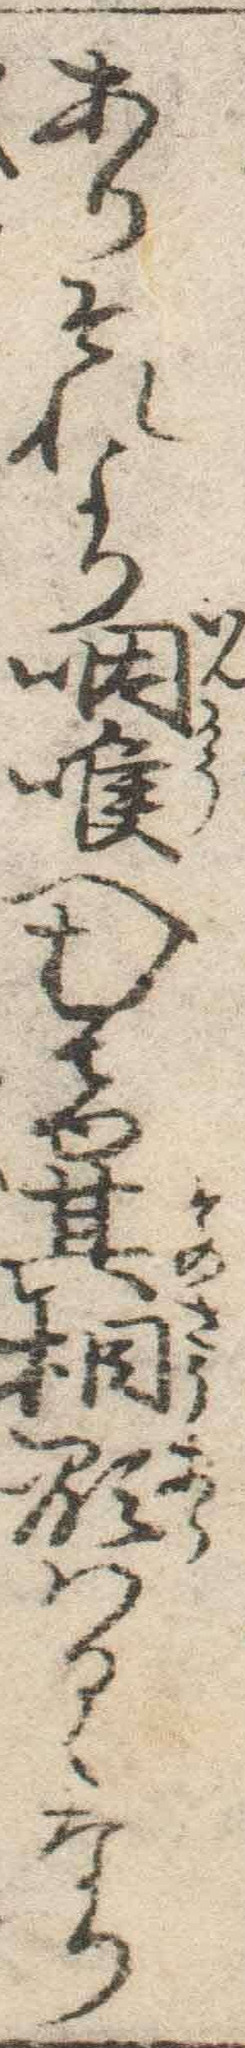ありそれより咽喉へむけ其相顕はるゝなり
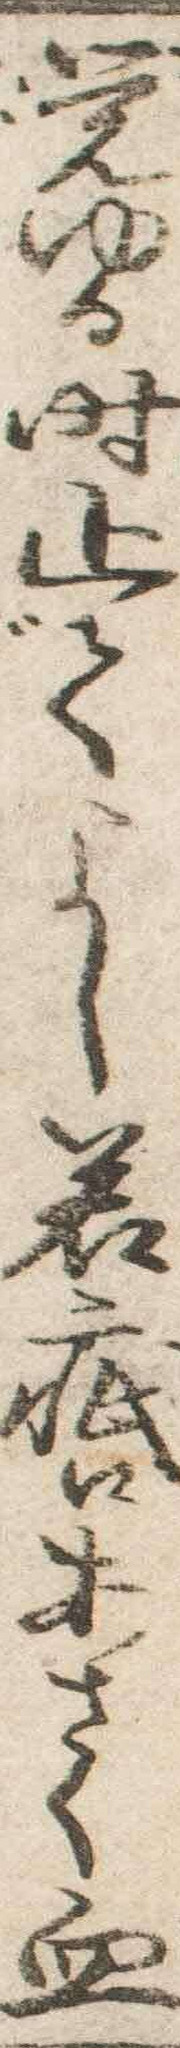覚ゆる時止てよし若疵口あさく血
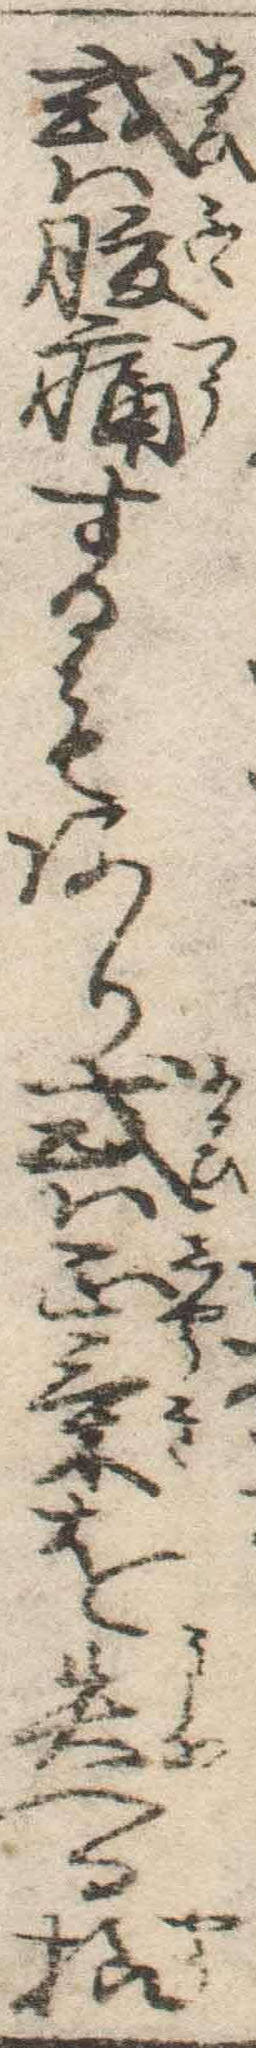或は腹痛するもあり或は正気を失へる様
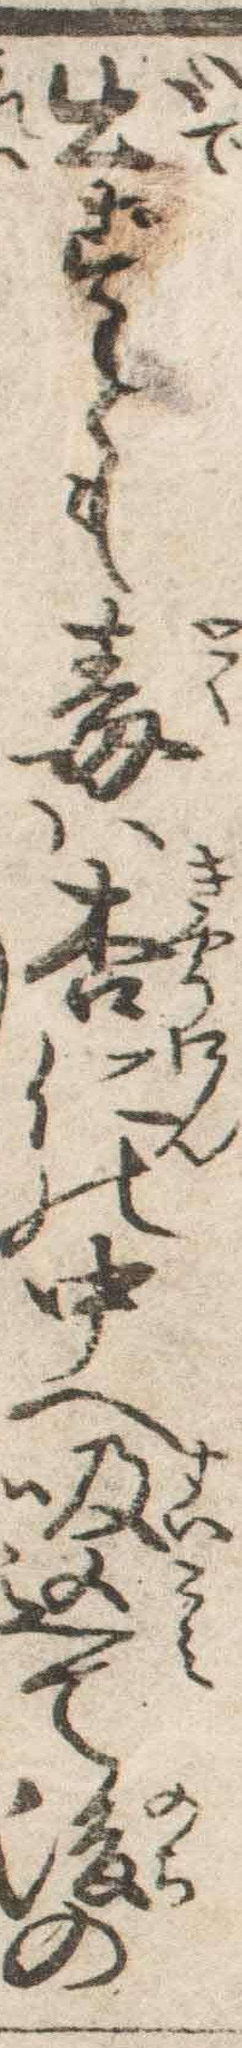出ずとも毒はい杏仁の中へ吸込て後の
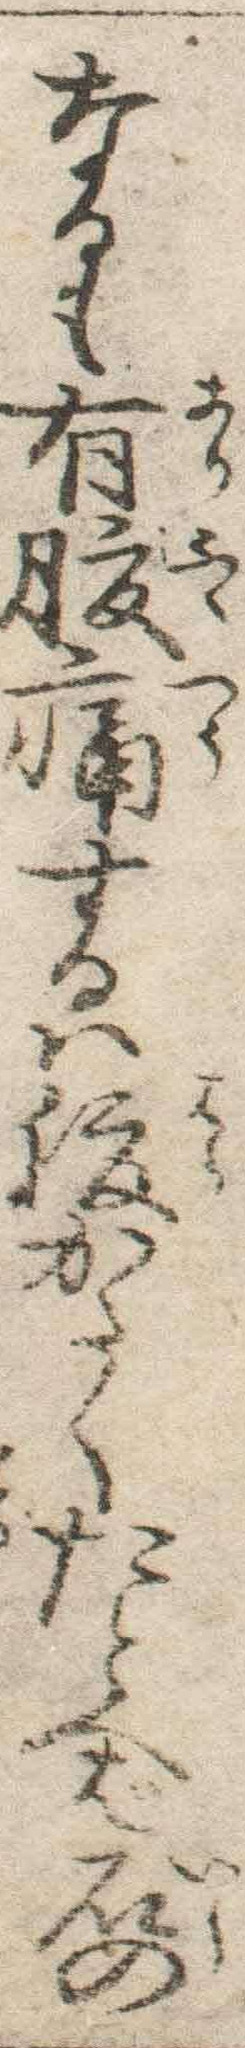なるも有腹痛するは腹かたくたとへば石の
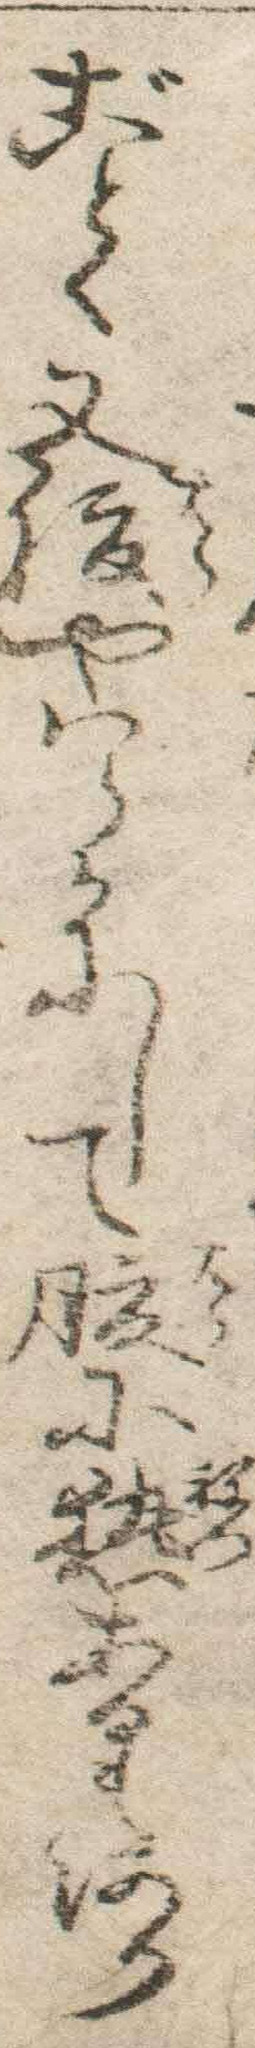ごとく又腹やはらかにして腹に熱あるもあり
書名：撫育草
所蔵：東京学芸大学附属図書館 国文学研究資料館
